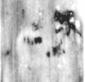凡
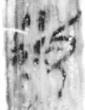○（亡）
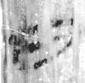日
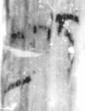多
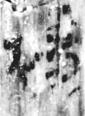晨
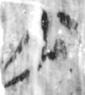少
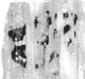日
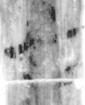必
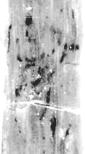○（得）
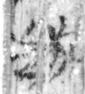歲（歲）
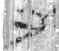之
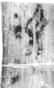後
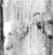亓（其）
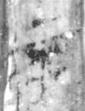不
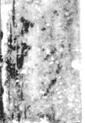死
